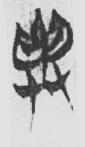與
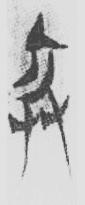兵
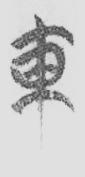車
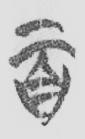百
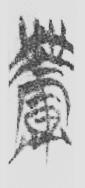{亠舛車}
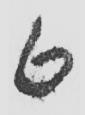㠯（以）
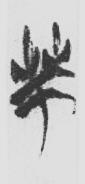芋
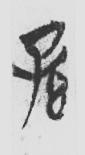孫
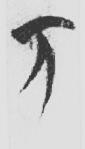兀
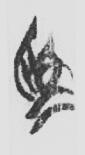爲
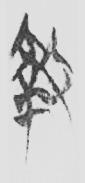執
